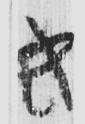女（如）
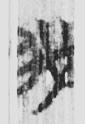我
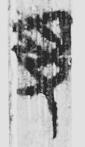𠭁
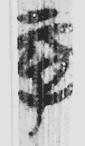娩（免）
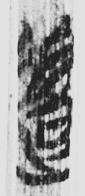后
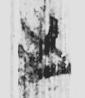之
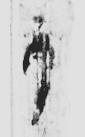人
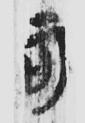可（何）
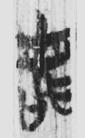若
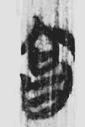○（答）
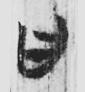曰
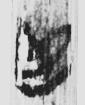臣
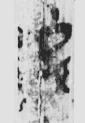弗
